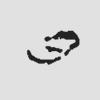日
